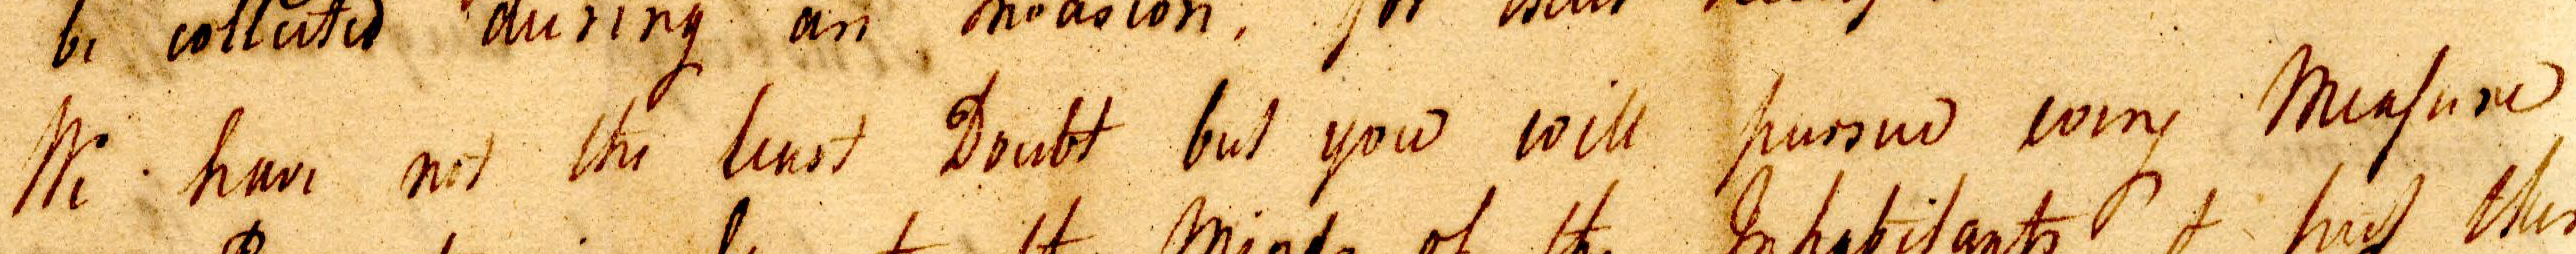We have not this least Doubt but you will pursue every Measure
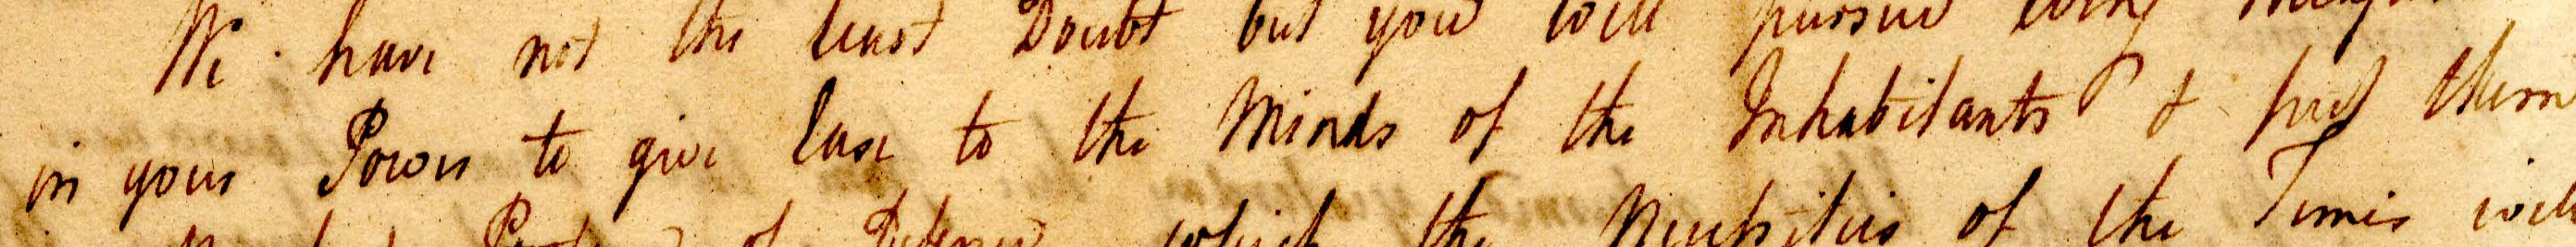in your Power to give last to the Minds of the Inhabitants & put them
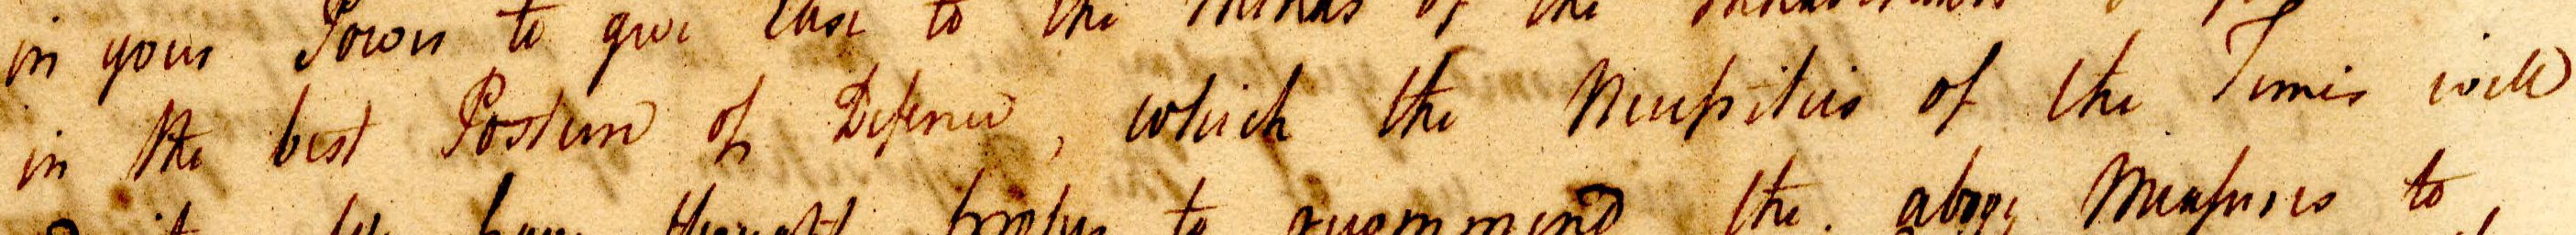in the best Position of Defence, which the Necessities of the Times will
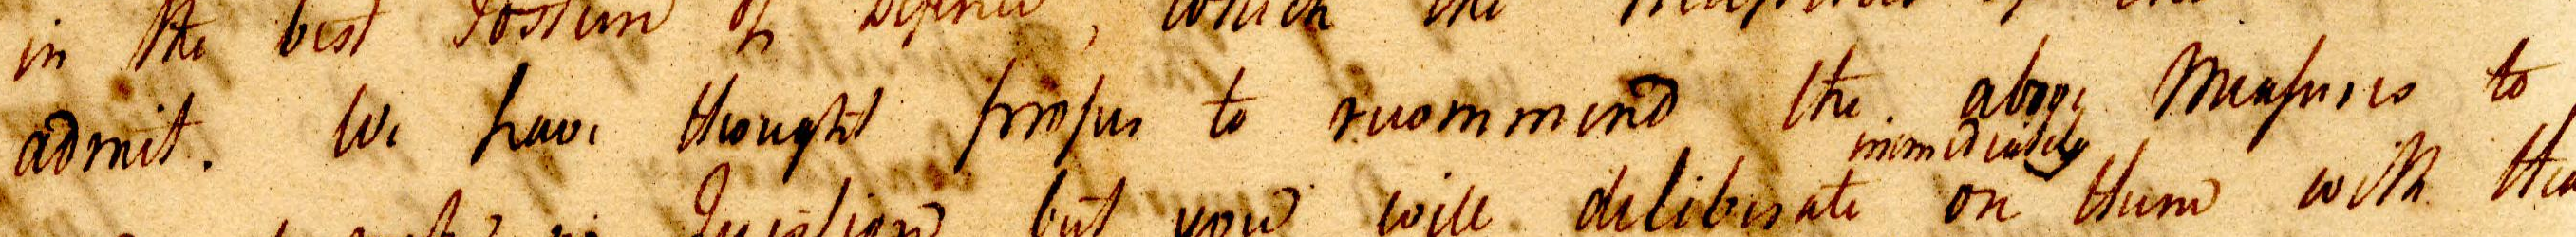admit. We have thought proper to recommend the above Measures to
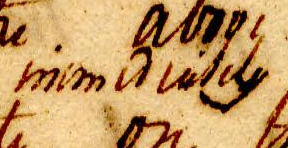immediately
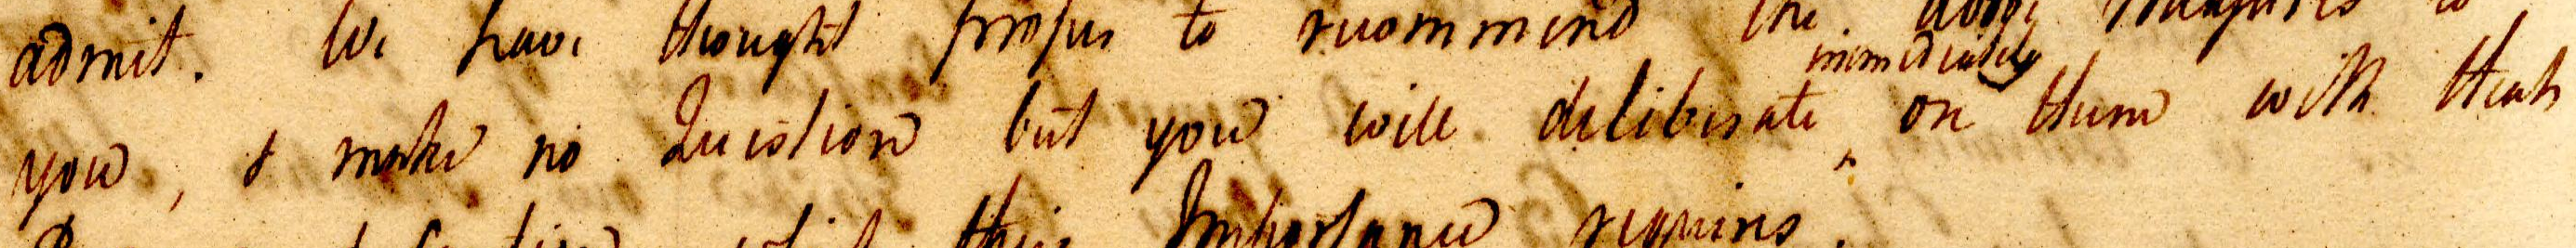you, & make no Question but you will deliberate ^ on them with that
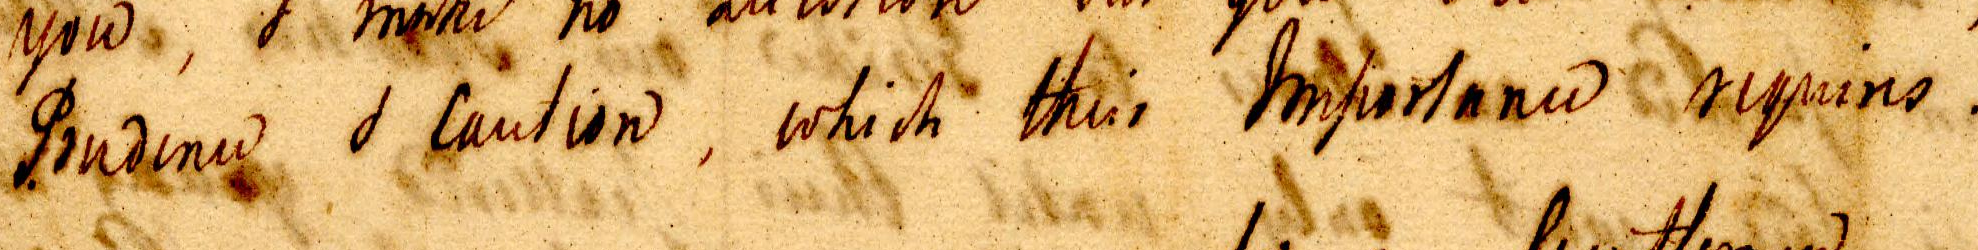Prudence & Caution, which this Importance requires.
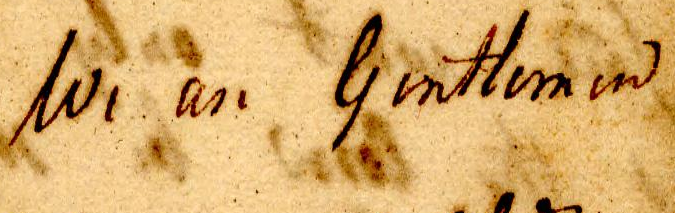We are Gentlemen
